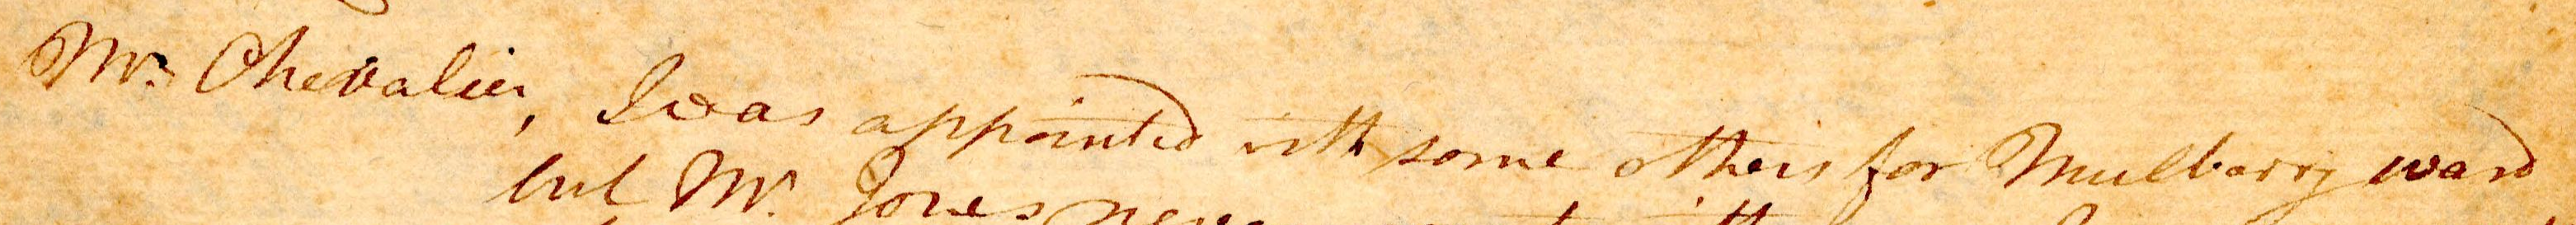M^r Chevalier, I was appointed with some others for Mulberry ward
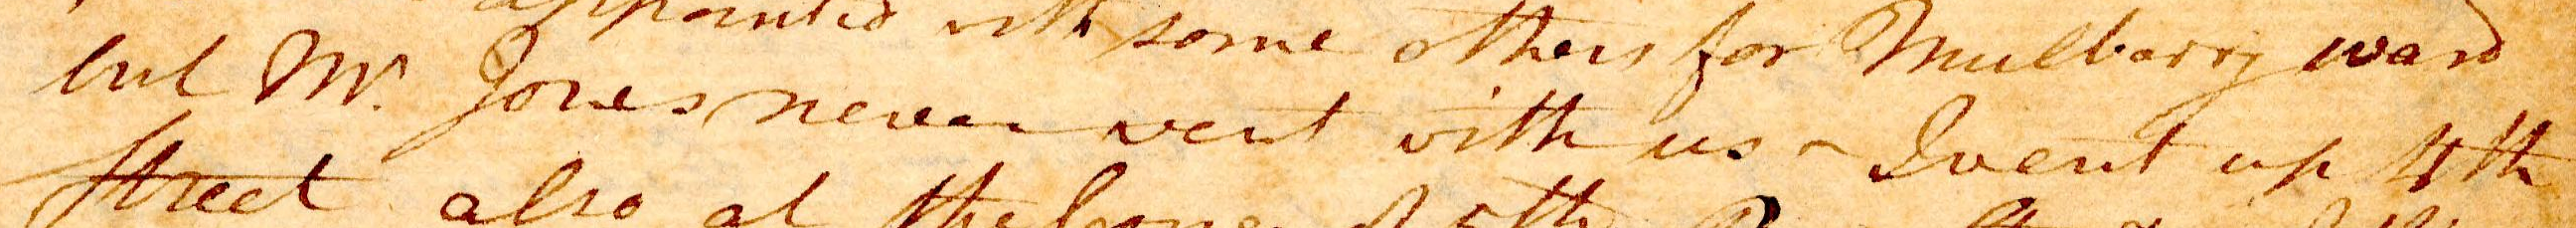but M^r. Jones never went with us- I went up 4th
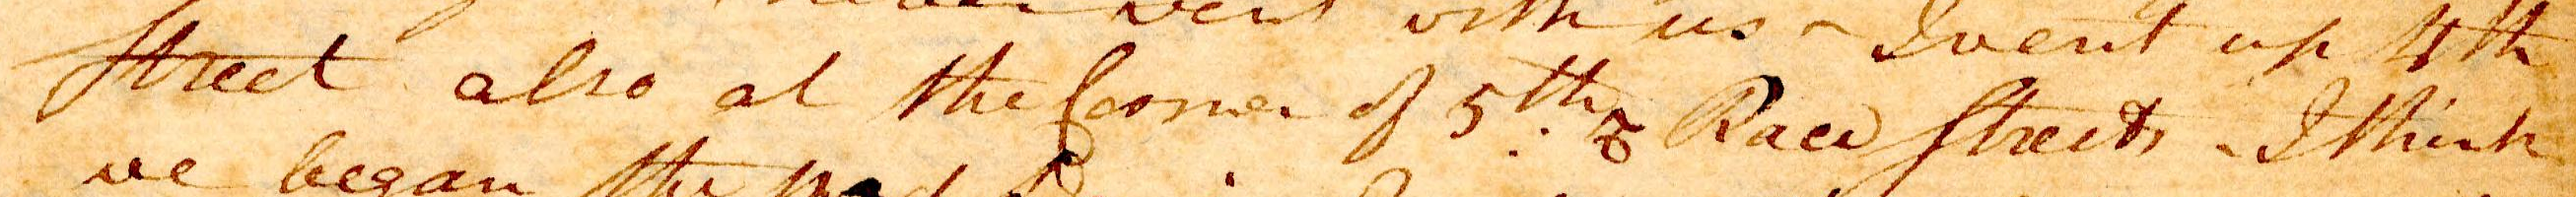Street also at the Corner of 5^th. & Race Streets. I think
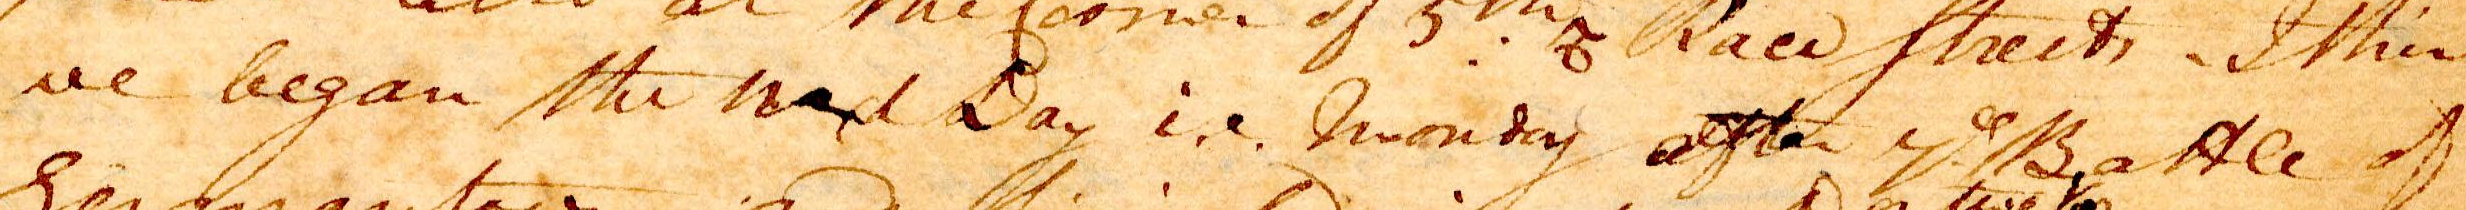we began the next Day i.e. Monday after y^e Battle of
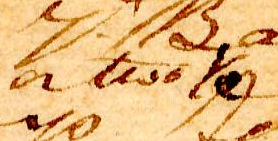or two
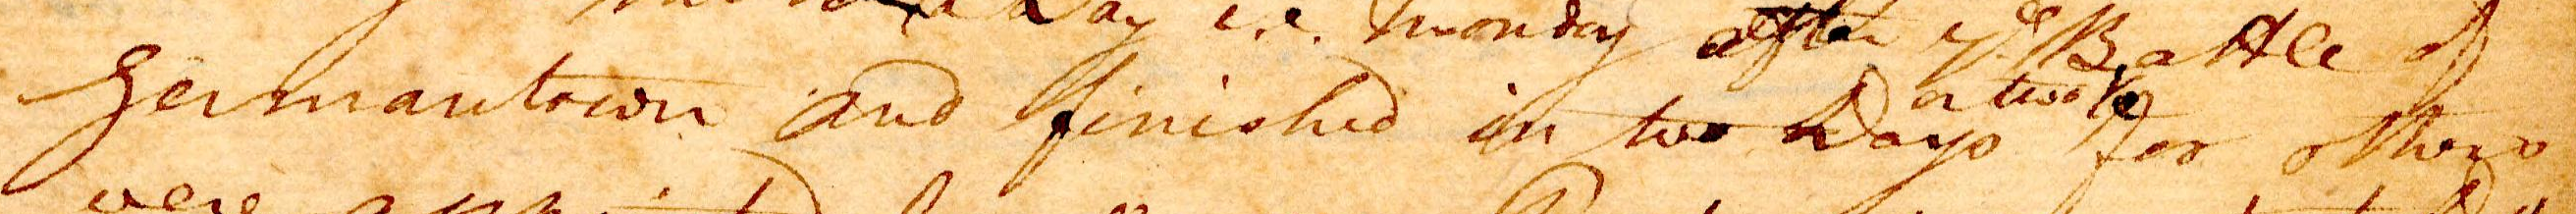Germantown and finished in two Days^ for others
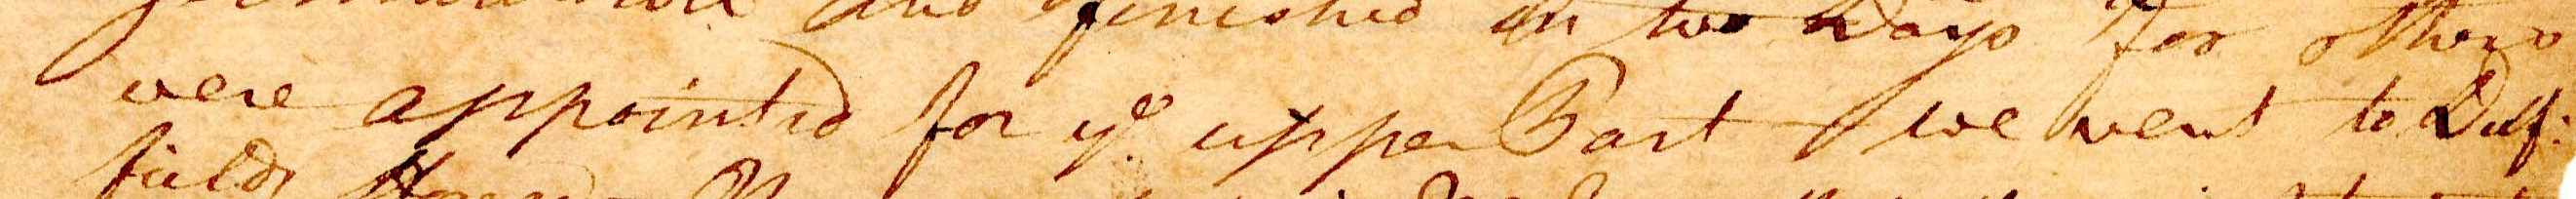were appointed for y^e. upper Cart we went to Day
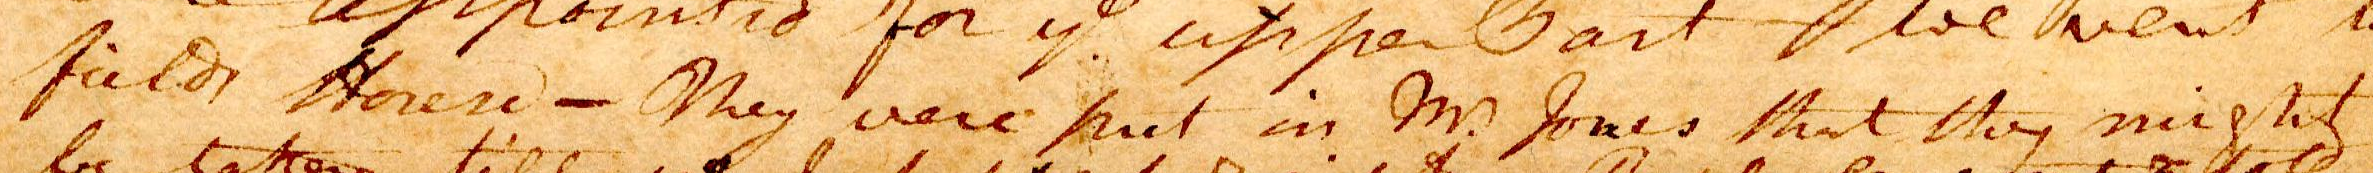Fields House- They were put in M^r. Jones that they might
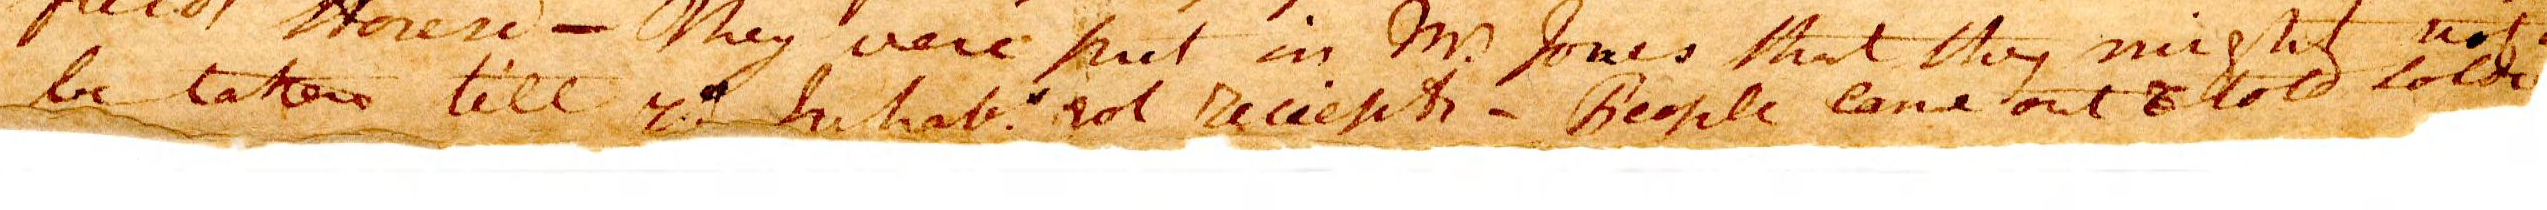be taken till y^e [__]hab not receipts- People came out & told Lord
